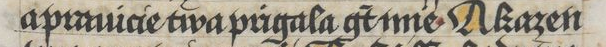a pravicie twa pṙigala ḡt me.A kazen
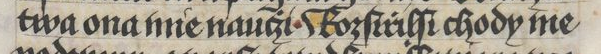twa ona mie naucżí.Rozſiṙilſi chody me
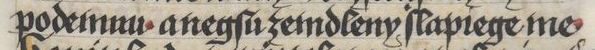podemnu.a negſu zemdleny ẛlapiege me.
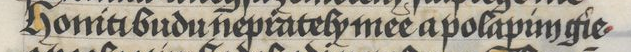Honiti budu nepṙately mee a polapím gie.
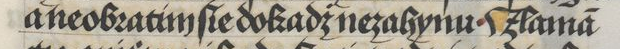a neobratim ſie dokadż nezahynu.Zlama¬
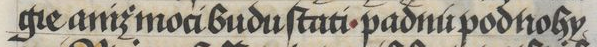gie aniž moci budu ſtati.padnú pod nohy
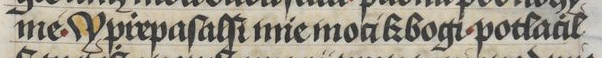mé.Y pṙepaſalſi mie mocí k bogi.potlaċil
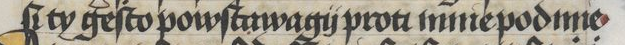ſy ty geẛto prowſtawagij proti mne pod mie.
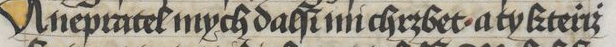A nepratel mych dalſi mi chrzbet.a ty kteṙiż
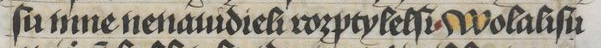ſu mne nenavidieli rozptylelſi.Wolaliſu
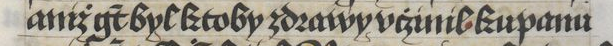aniż ḡt byl k toby zdrawy ucżinil.ku panu
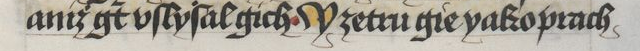aniż ḡt oſlyẛal gich.Y zetru gie yako prach
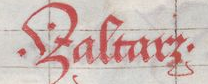.Żaltarz.
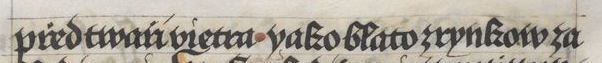před twaṙí vietra.yako blato z rynkow za¬
